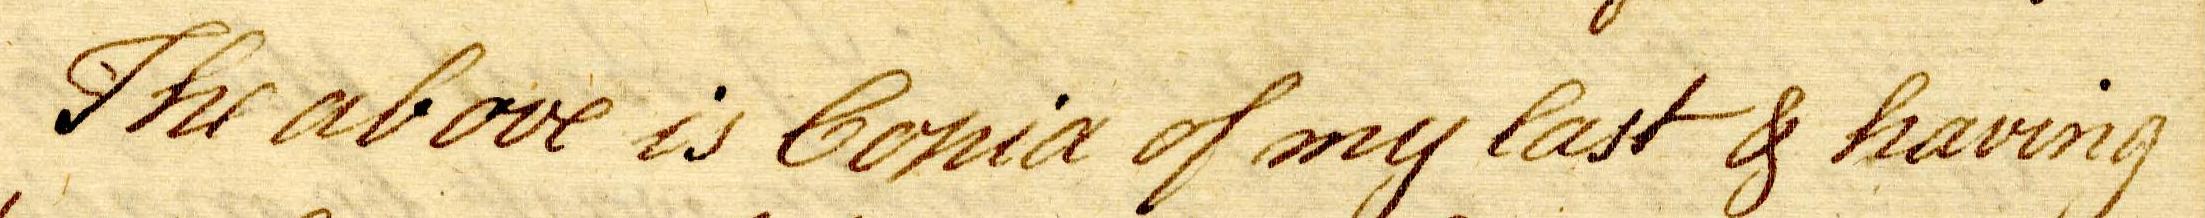The above is Copia of my last & having
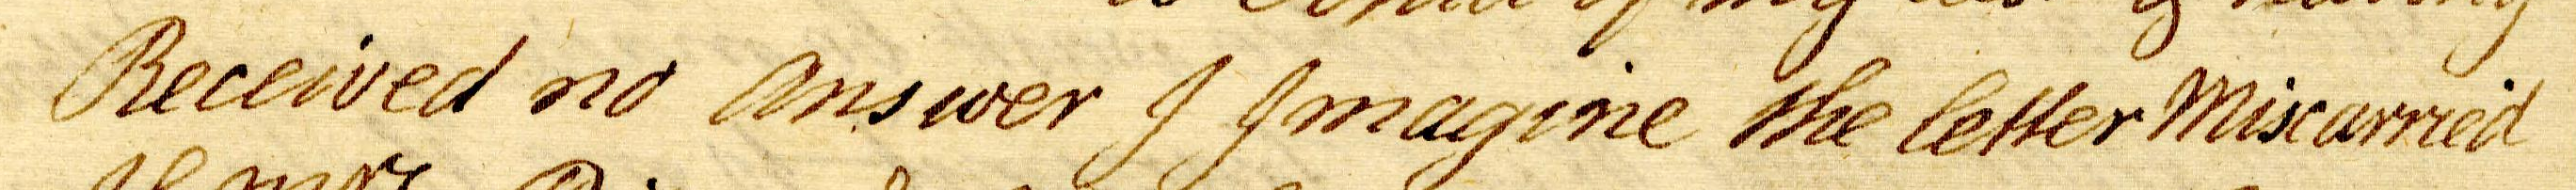Received no Answer I Imagine the letter Miscarried
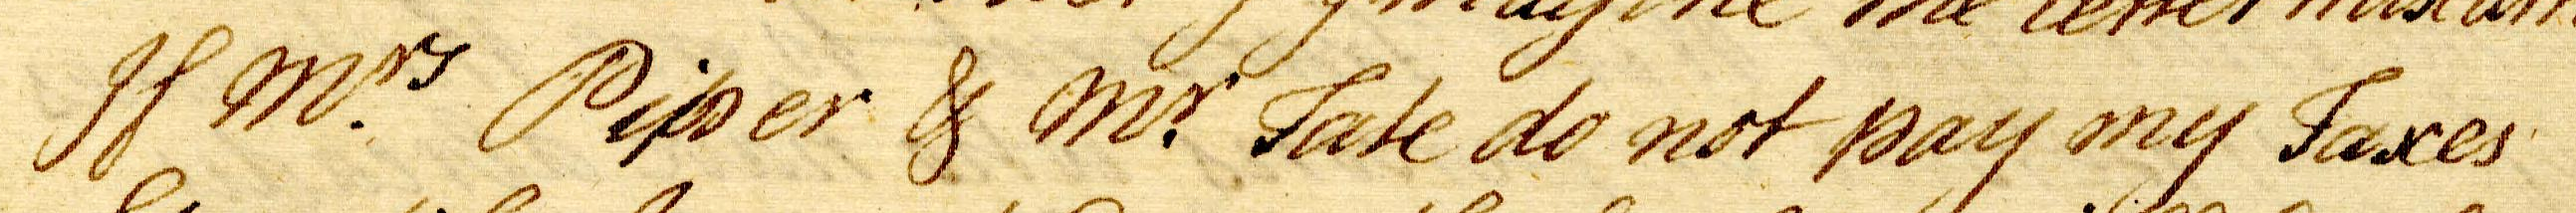If M^rs. Piper & Mr. Tate do not pay my Taxes
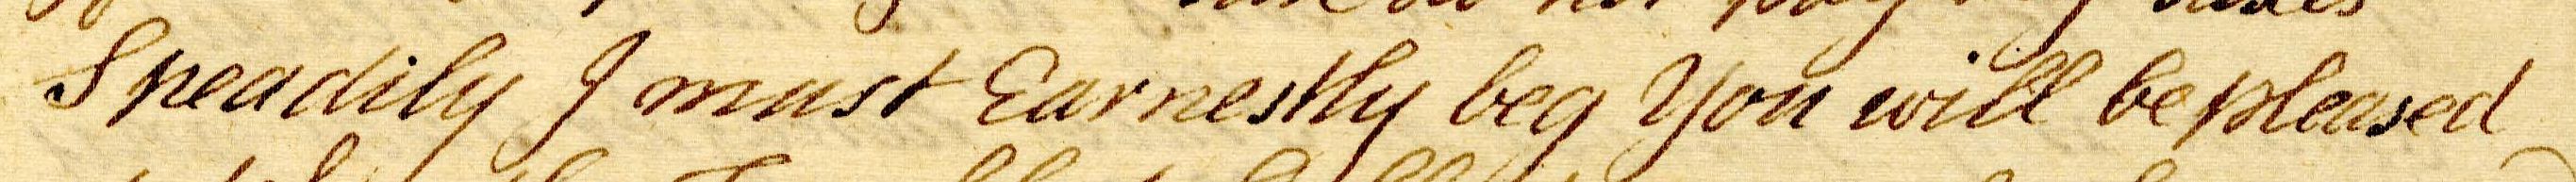Speadily I must Earnestly beg You will be pleased
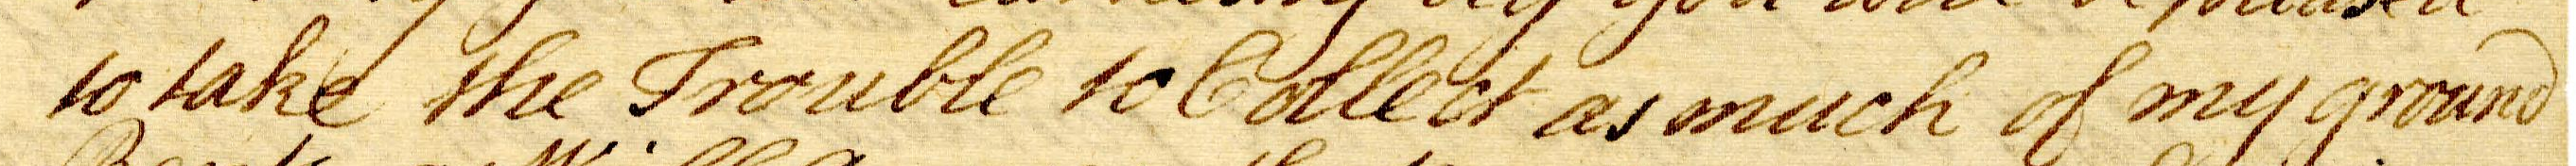to take the Trouble to Collect as much of my ground
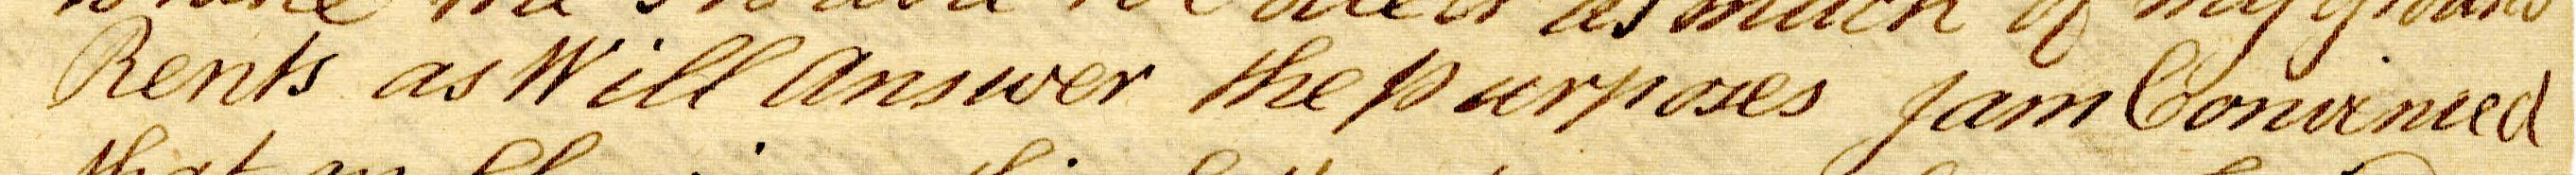Rents as Will Answer the Purposes I am Convinced
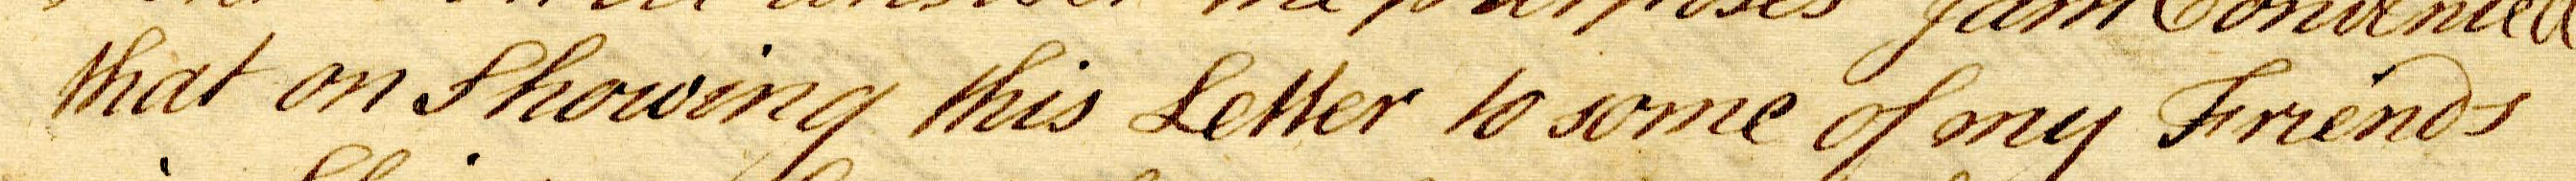that on Showing this Letter to some of my Friends
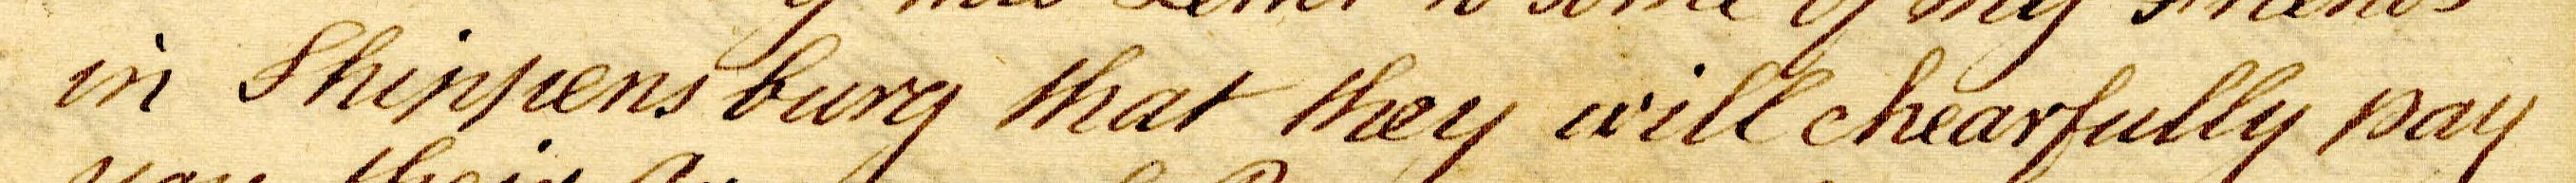in Shippensburg that they will chearfully pay
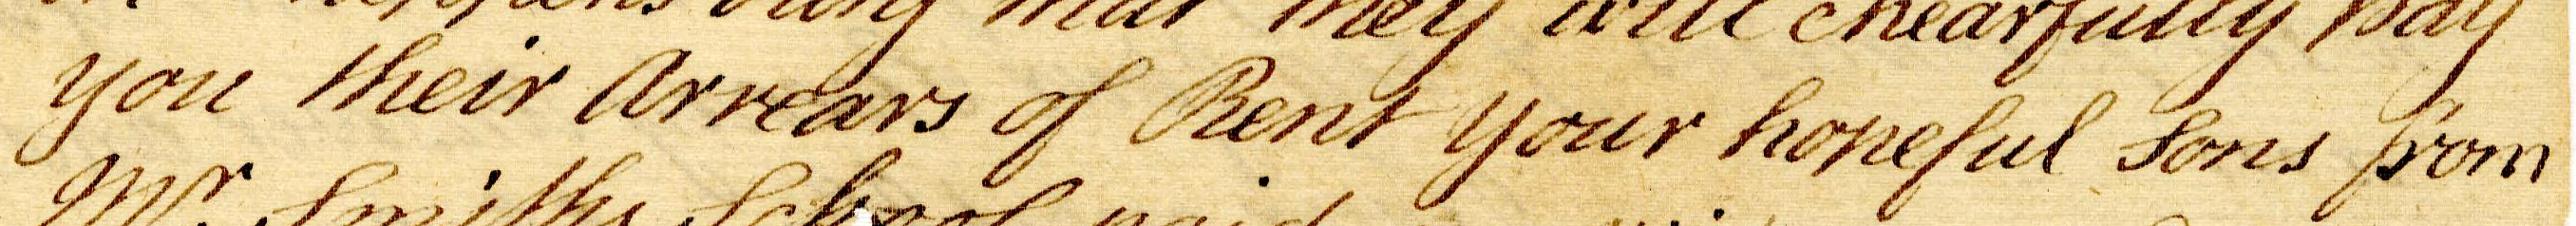you their Arrears of Rent Your hopeful Sons from
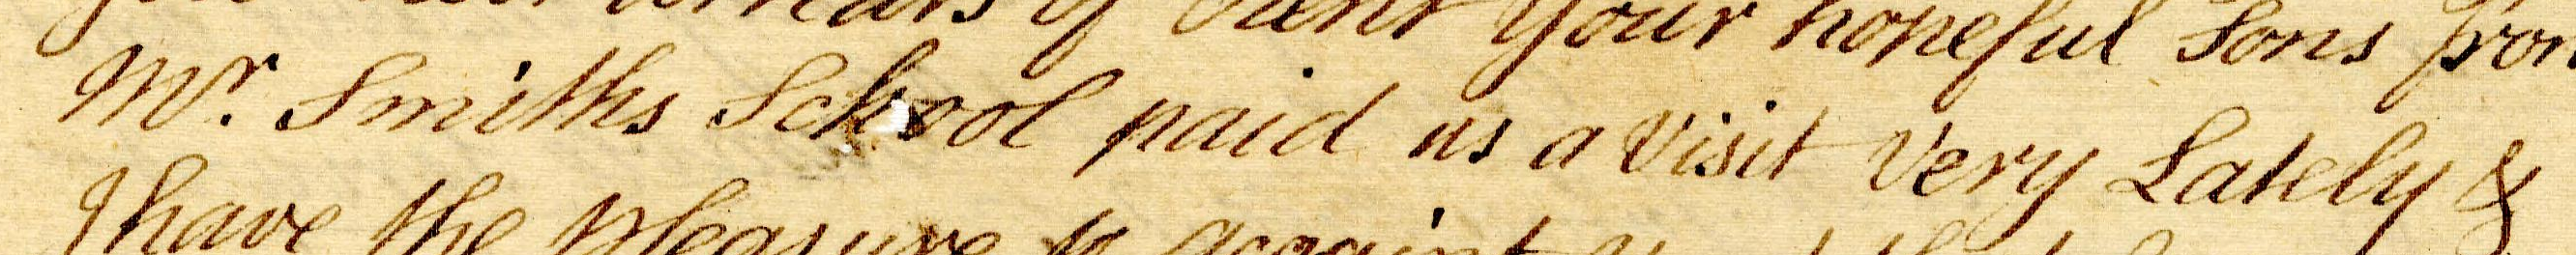M^r. Smiths School paid us a Visit Very Lately &
